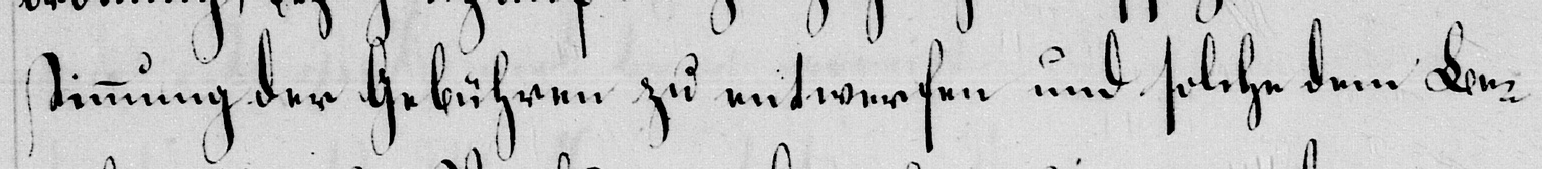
stimmung der Gebühren zu entwerfen und solche dem Be¬
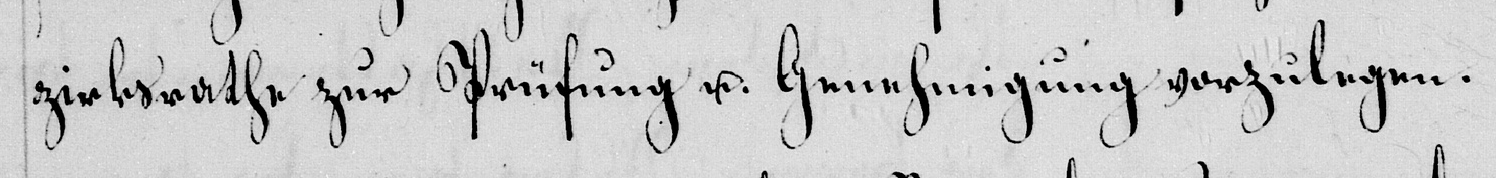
zirksrathe zur Prüfung u. Genehmigung vorzulegen.
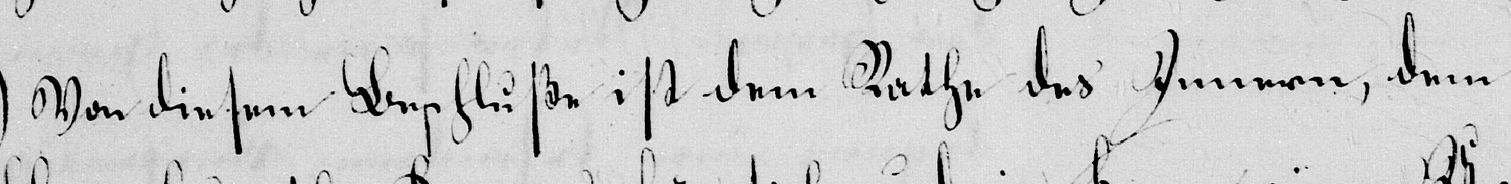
Von diesem Beschluße ist dem Rathe des Innern, dem
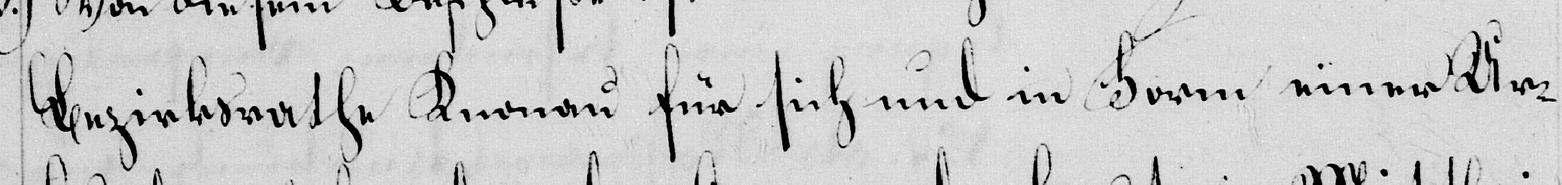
Bezirksrathe Knonau für sich und in Form einer Ur¬
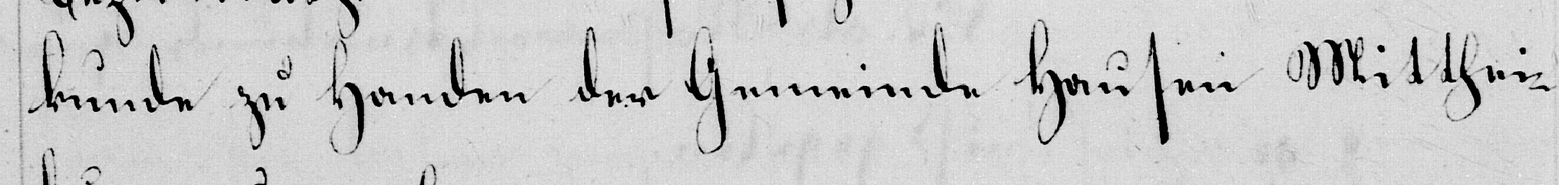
kunde zu Handen der Gemeinde Hausen Mitthei¬
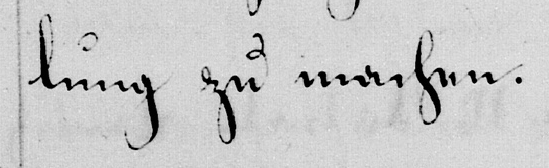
lung zu machen.
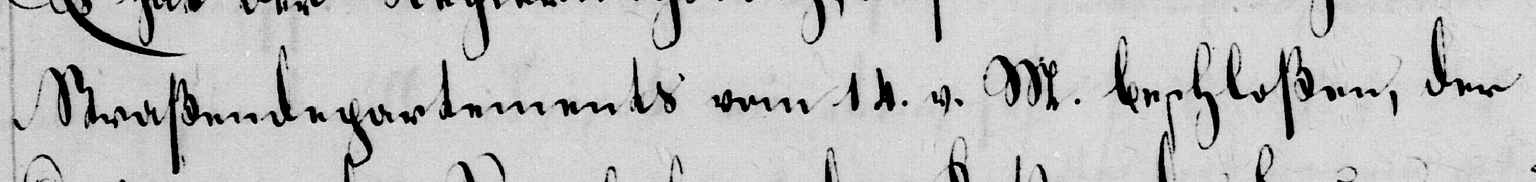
Straßendepartements vom 14. v. M. beschloßen, der
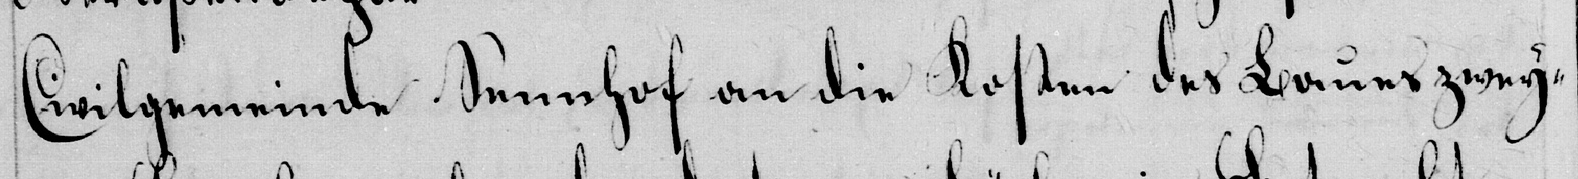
Civilgemeinde Sennhof an die Kosten des Baues zwey¬
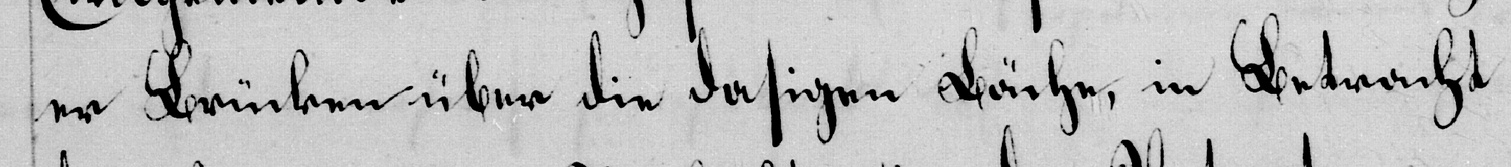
er Brücken über die dasigen Bäche, in Betracht
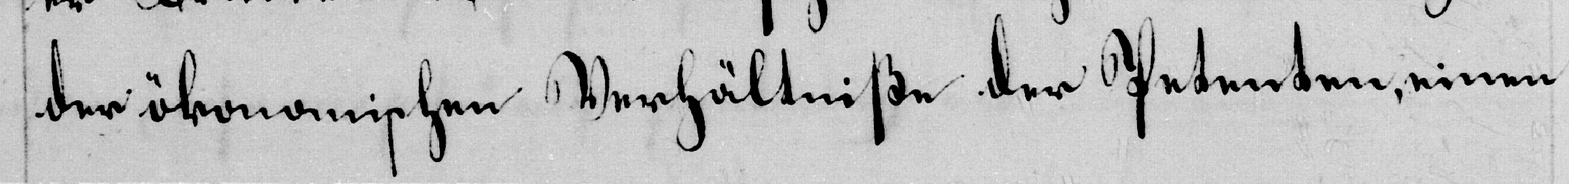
der ökonomischen Verhältniße der Petenten, einen
